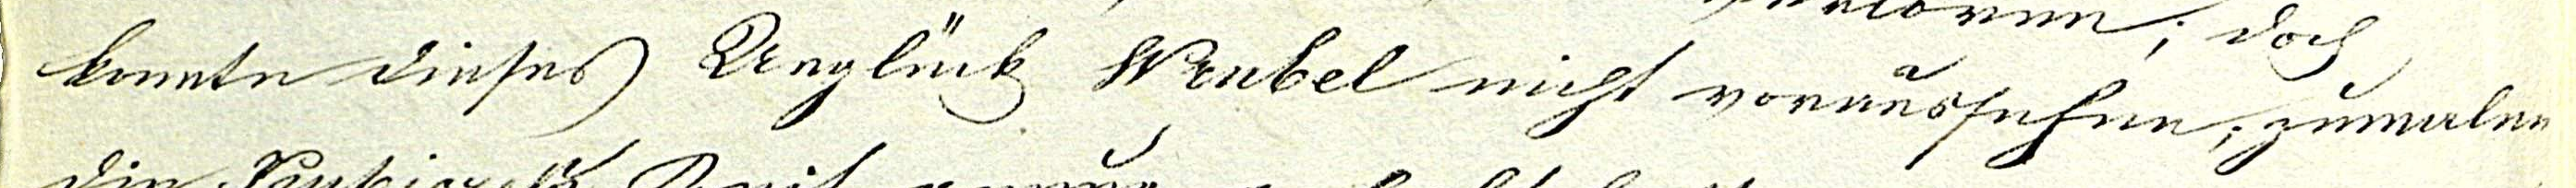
konnte dieses Unglück Wrubel nicht voraussehen; zumalen
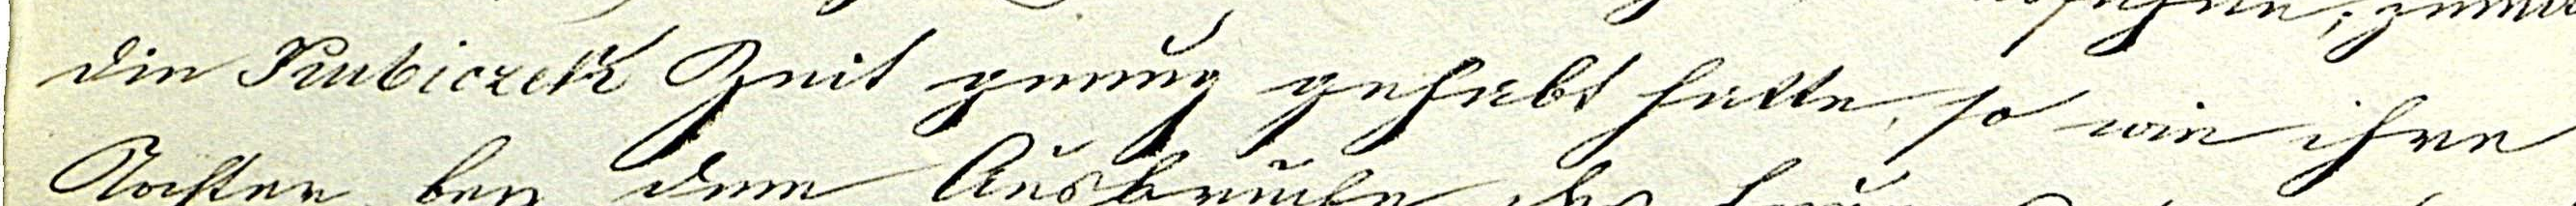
die Kubiczek Zeit genug gehabt hatte, so wie ihre
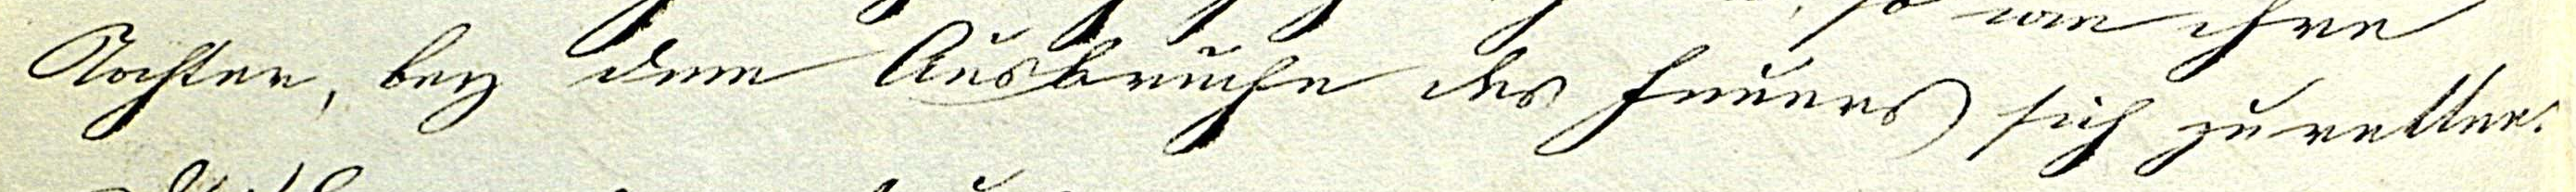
Tochter, bey dem Ausbruche des Feuers sich zu retten.
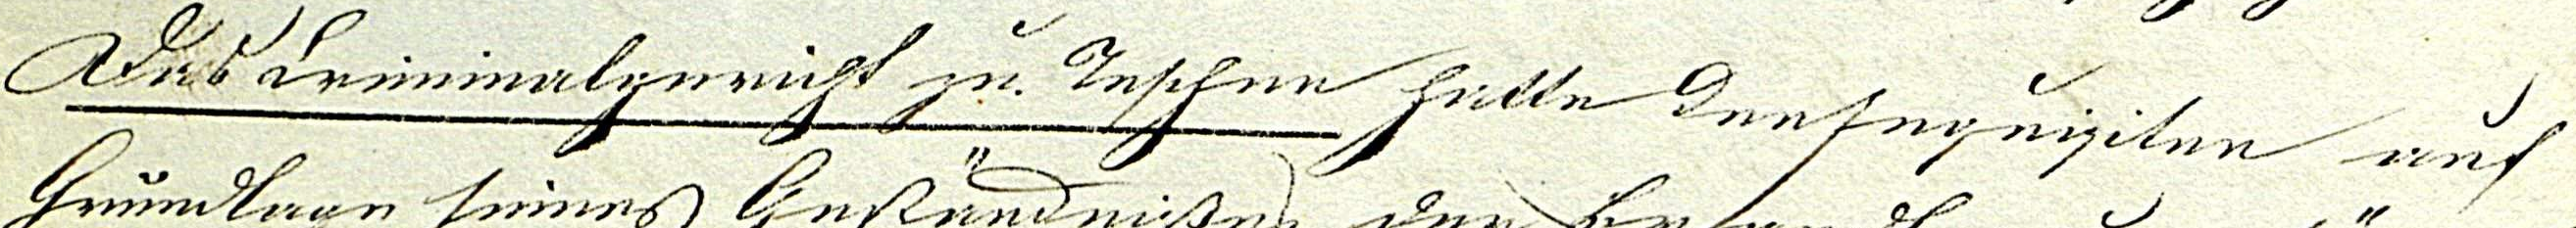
Das Criminalgericht zu Teschen hatte den Inquisiten auf
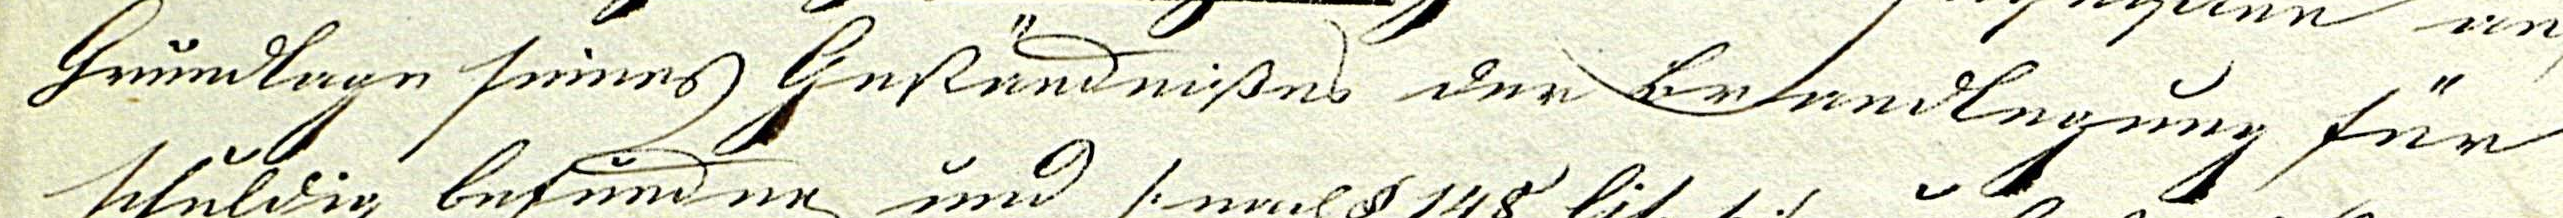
Grundlage seines Geständnißes der Brandlegung für
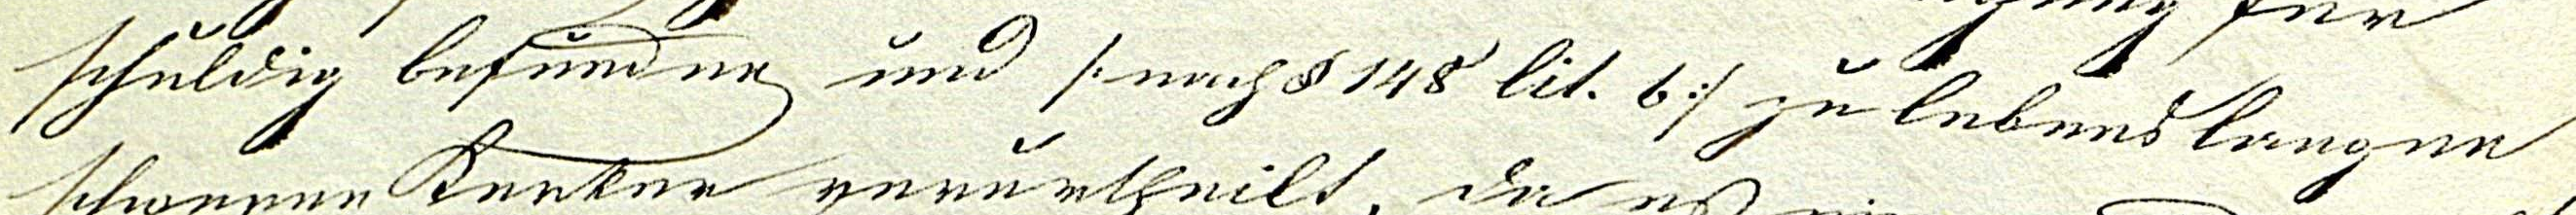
schuldig befunden und (nach §148 lit b) zu lebenslangen
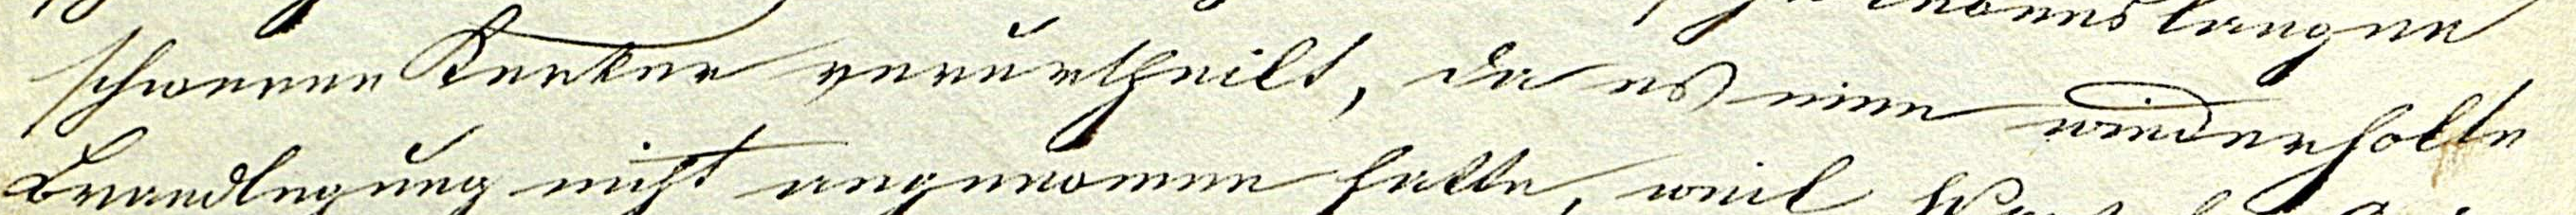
schweren Kerker verurtheilt, da es eine wiederholte
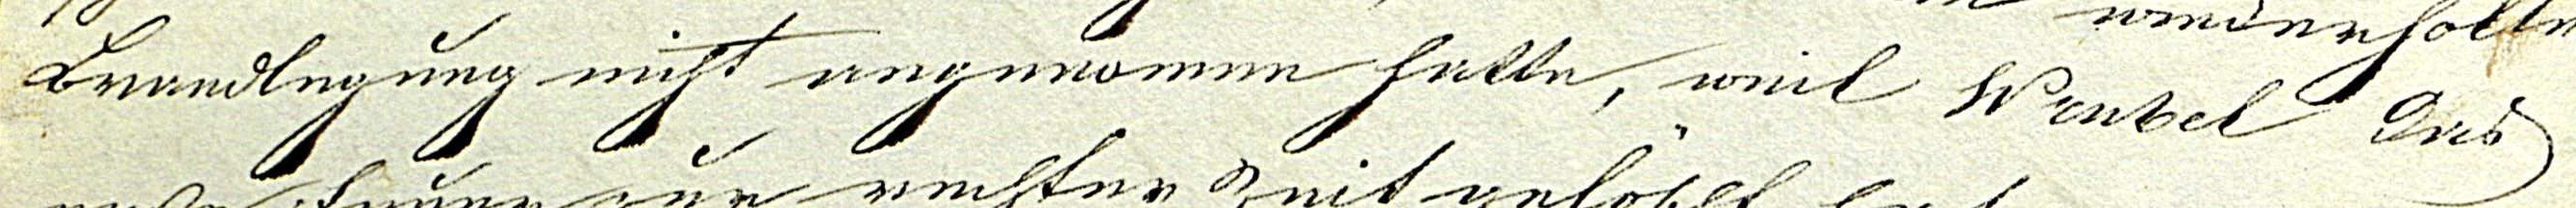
Brandlegung nicht angenommen hatte, weil Wrubel das
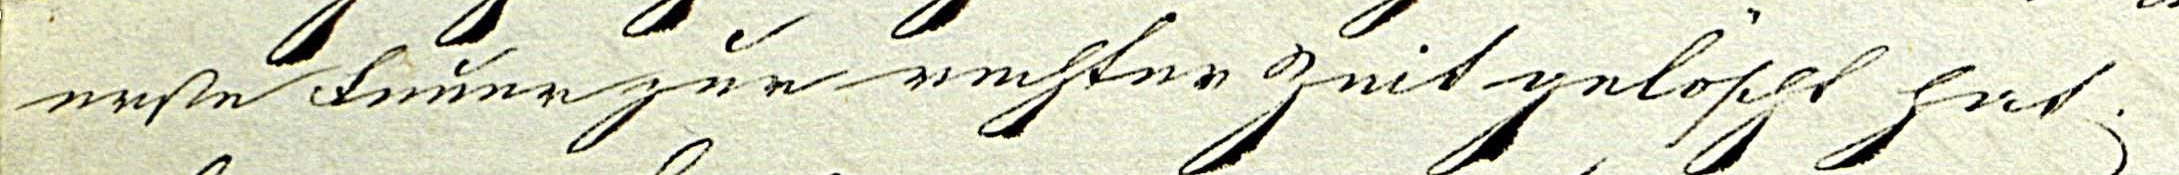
erste Feuer zur rechter Zeit gelöscht hat.
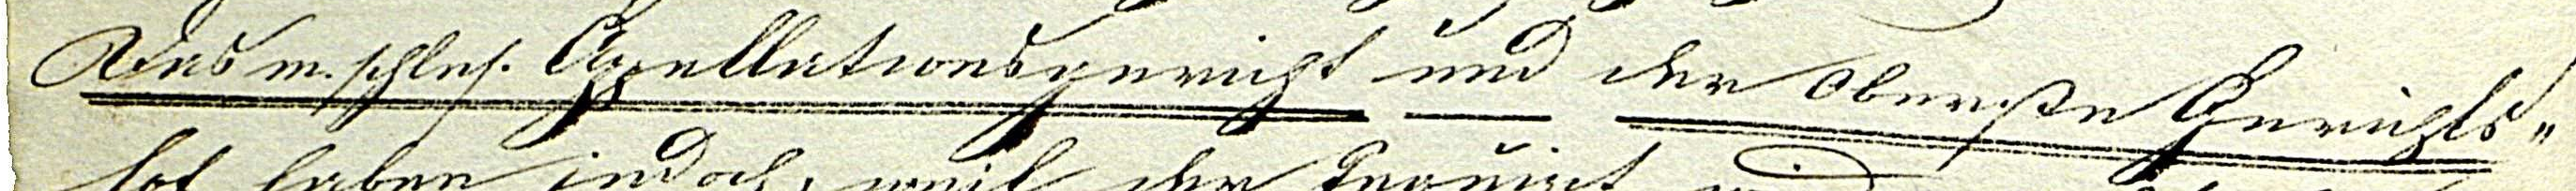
Das m. schles. Appellationsgericht und der Oberste Gerichts¬
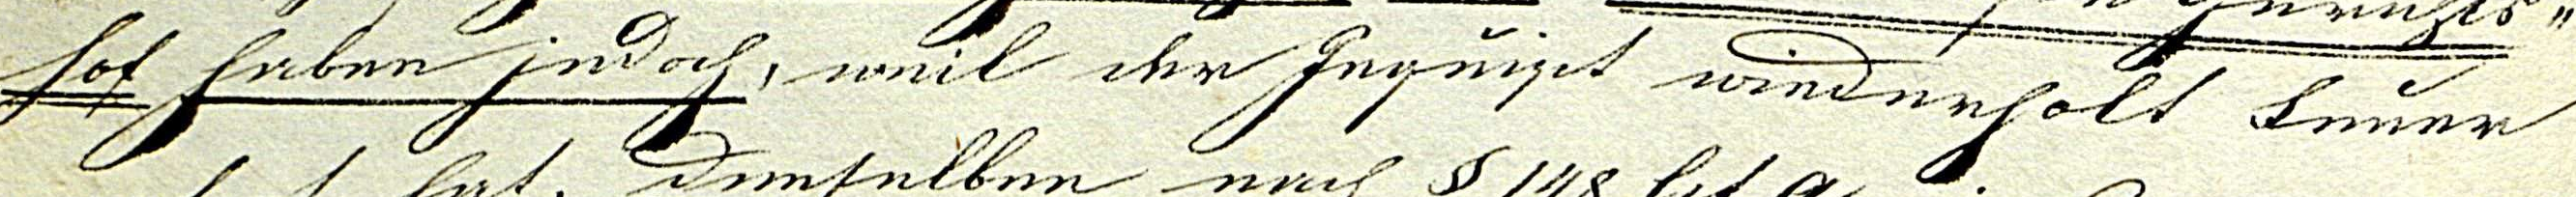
hof haben jedoch, weil der Inquisit wiederholt Feuer
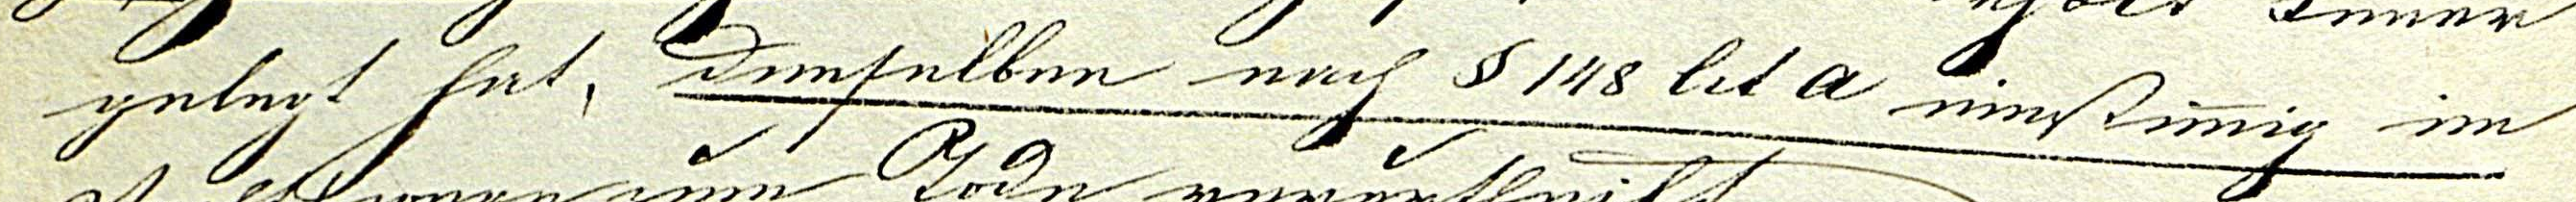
gelegt hat, demselben nach 148 lit A einstimmig im
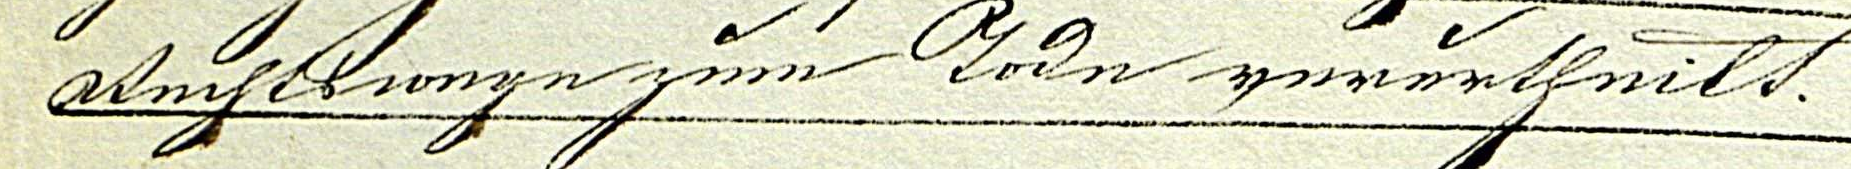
Rechtswege zum Tode verurtheilt.
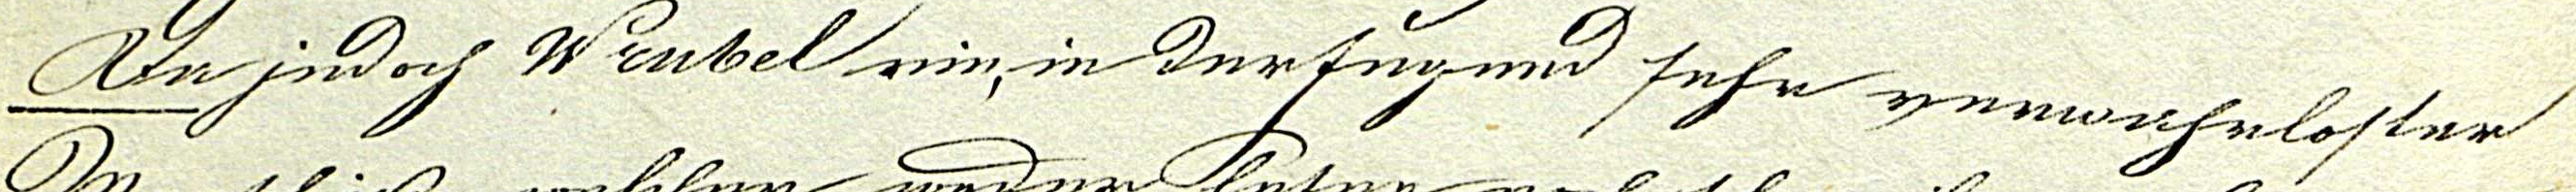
Da jedoch Wrubel ein, in der Jugend sehr verwahrloster
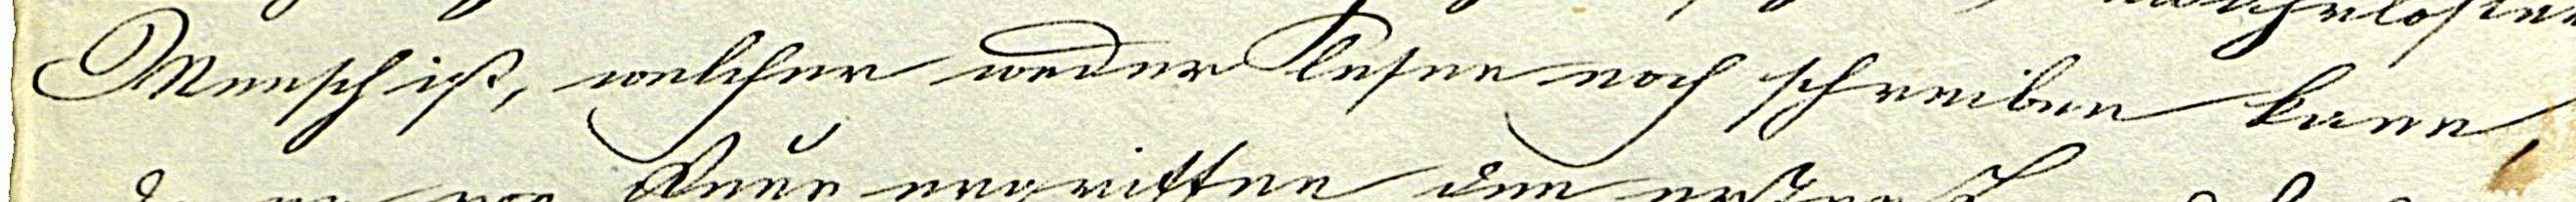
Mensch ist, welcher weder lesen noch schreiben kann,
